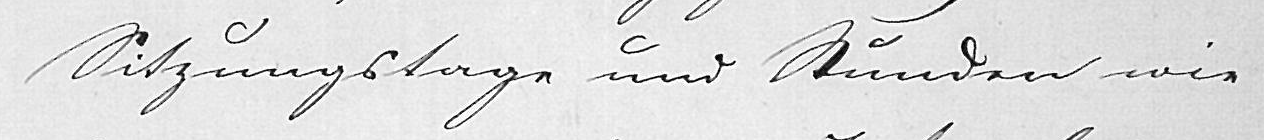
Sitzungstage und Stunden wie
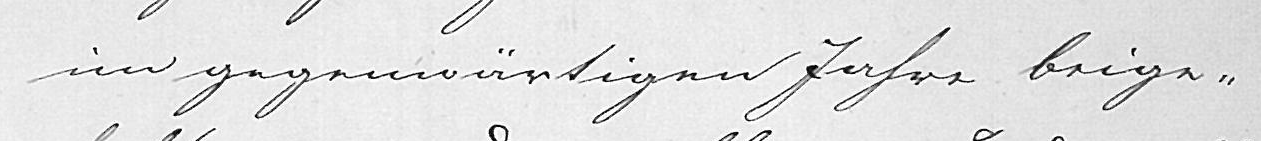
in gegenwärtigen Jahre beige-
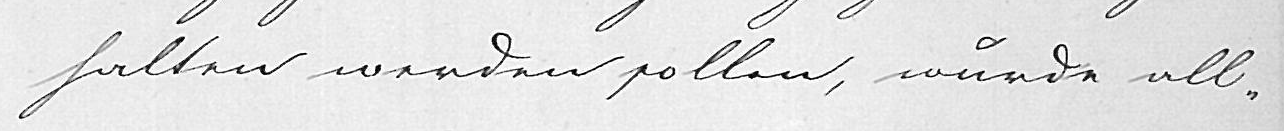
halten werden sollen, wurde all-
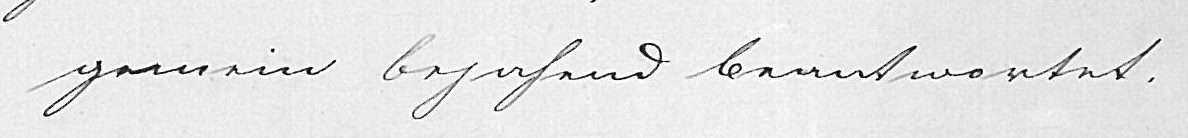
gemein bejahend beantwortet.
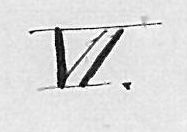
VI.
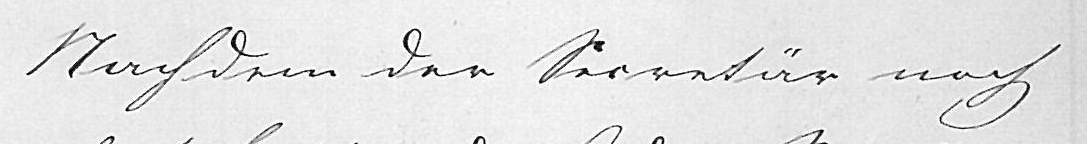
Nachdem der Secretär noch
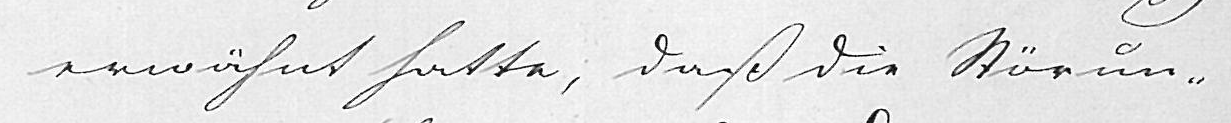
erwähnt hatte, daß die Störun-
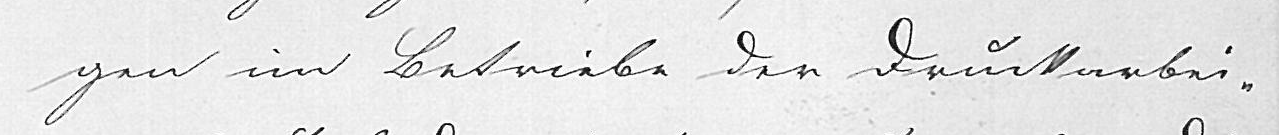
gen im Betriebe die Druckarbei-
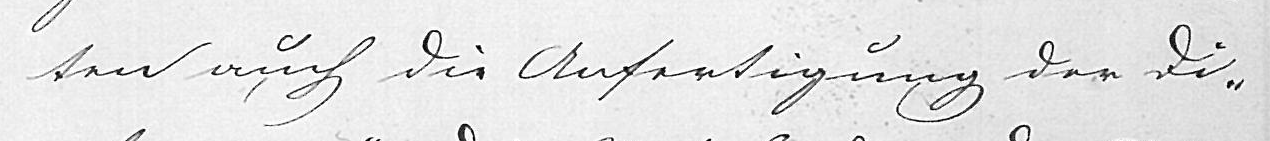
ten auch die Anfertigung der Di-
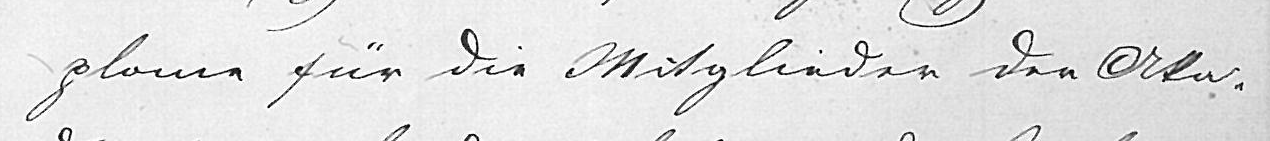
plome für die Mitglieder der Aka-
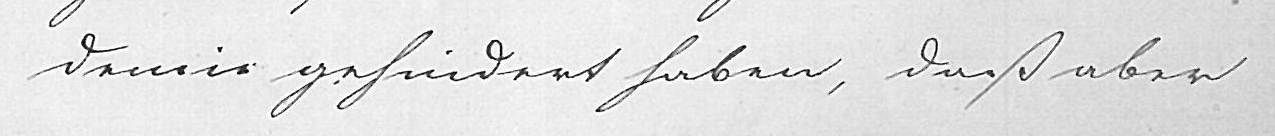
demie gehindert haben, daß aber
